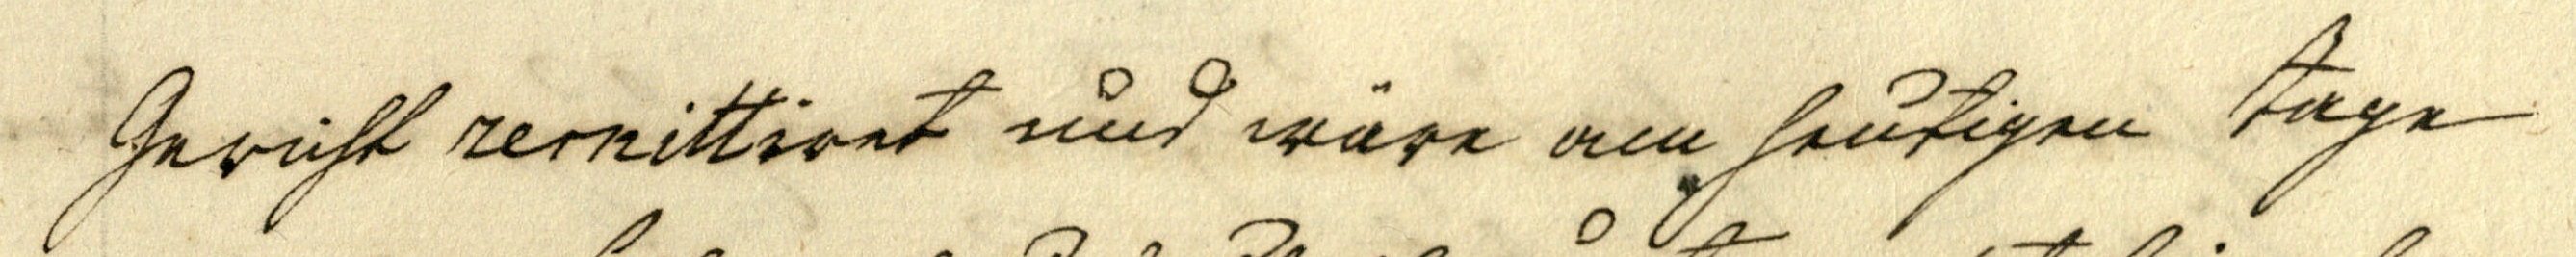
Gericht remittiret und wäre am heutigen Tage
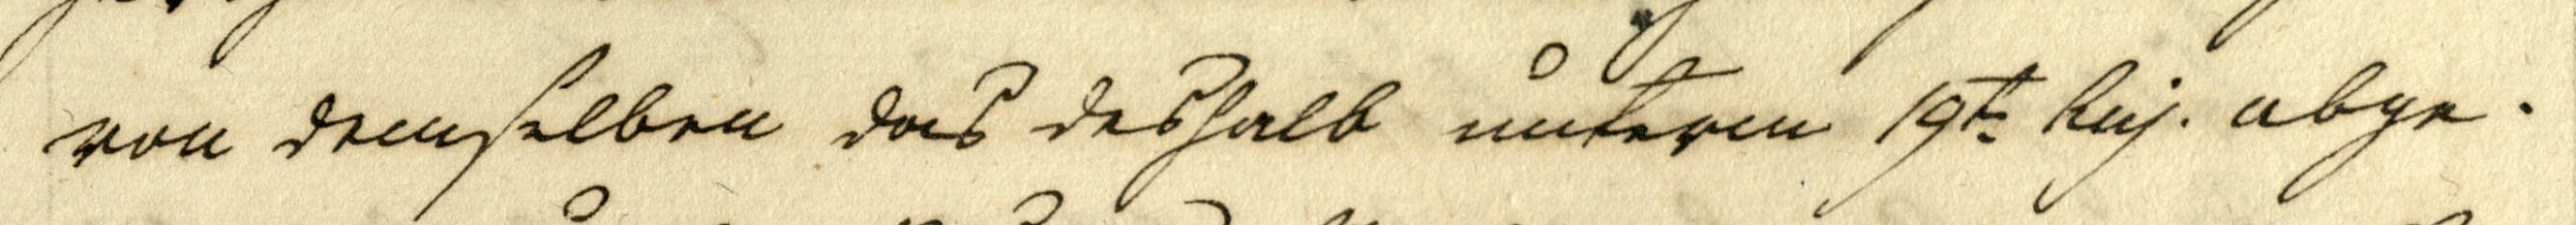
von demselben das deshalb unterm 19ten huj. abge-
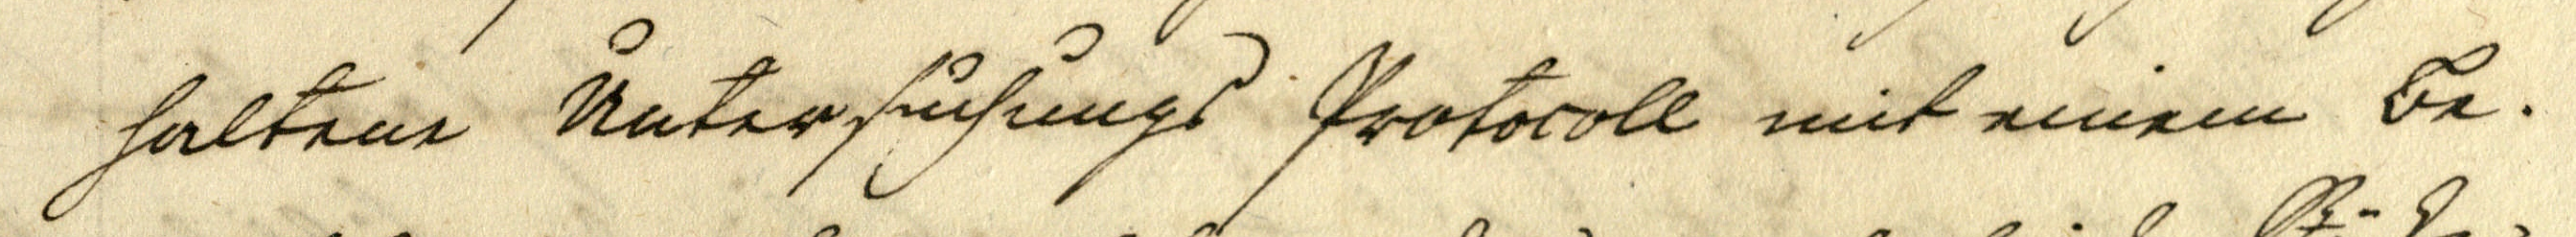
haltene Untersuchungs Protocoll mit einem Be-
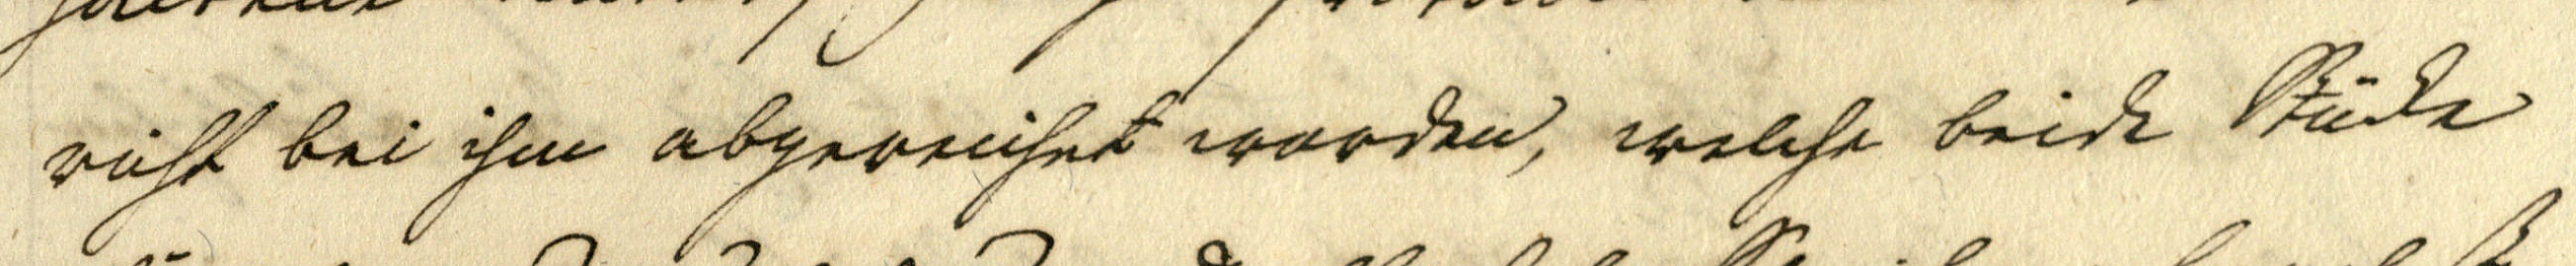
richt bei ihm abgereichet worden, welche beide Stücke
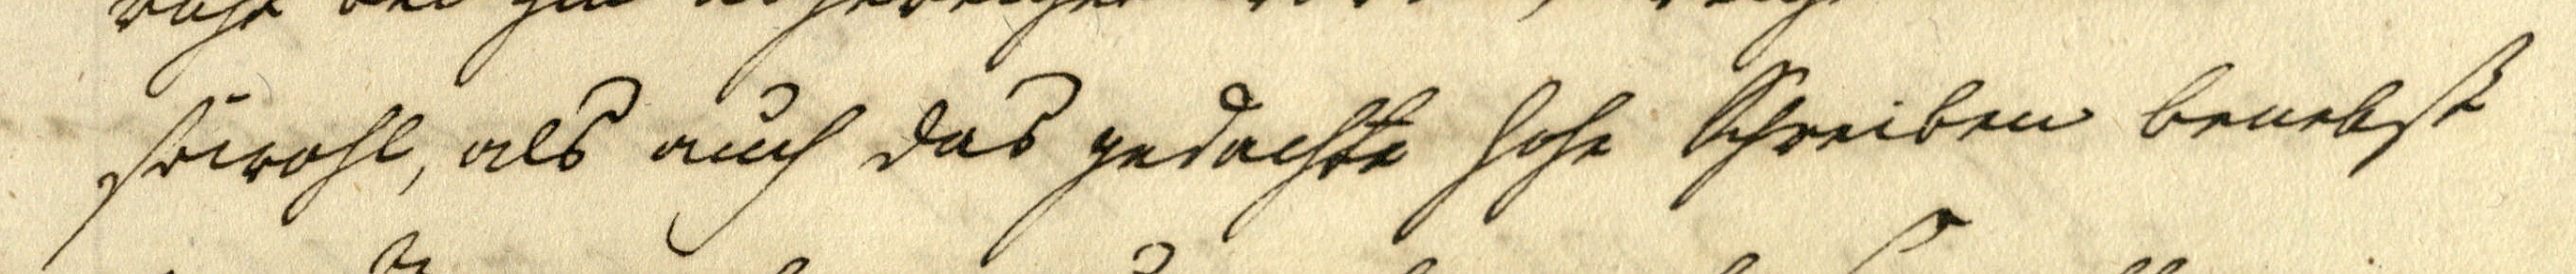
sowohl, als auch das gedachte hohe Schreiben benebst
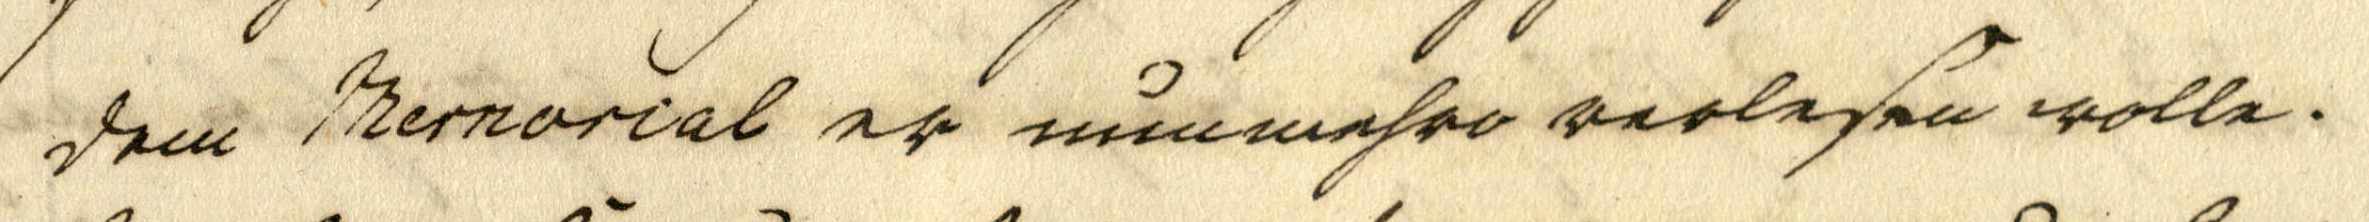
dem Memorial er nunmehro verlesen wolle.
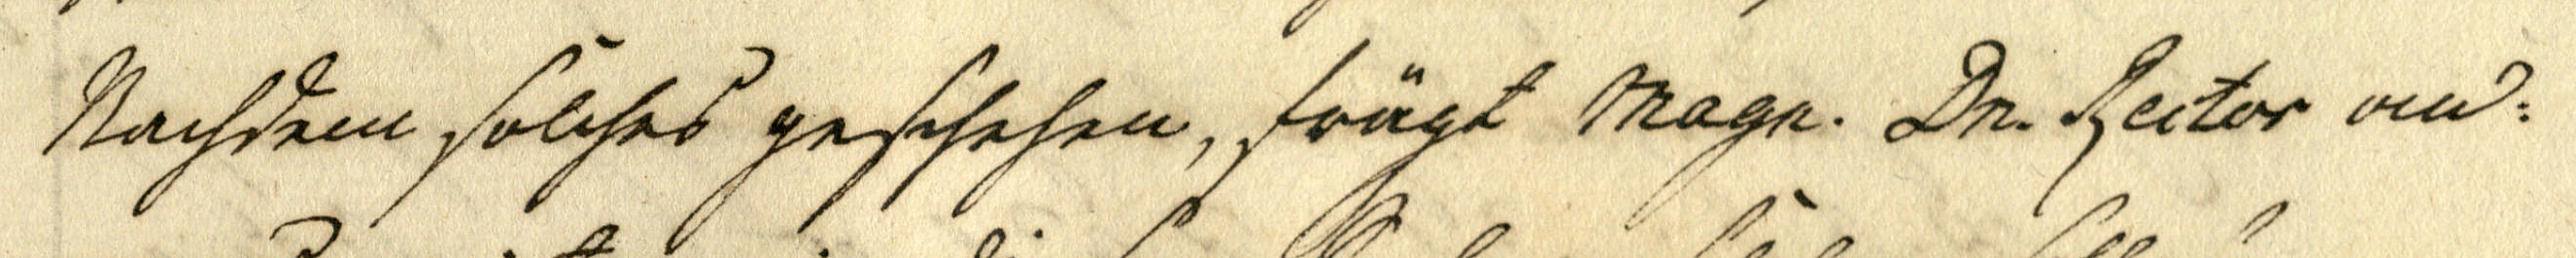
Nachdem solches geschehen, frägt Magn. Dn. Rector an:
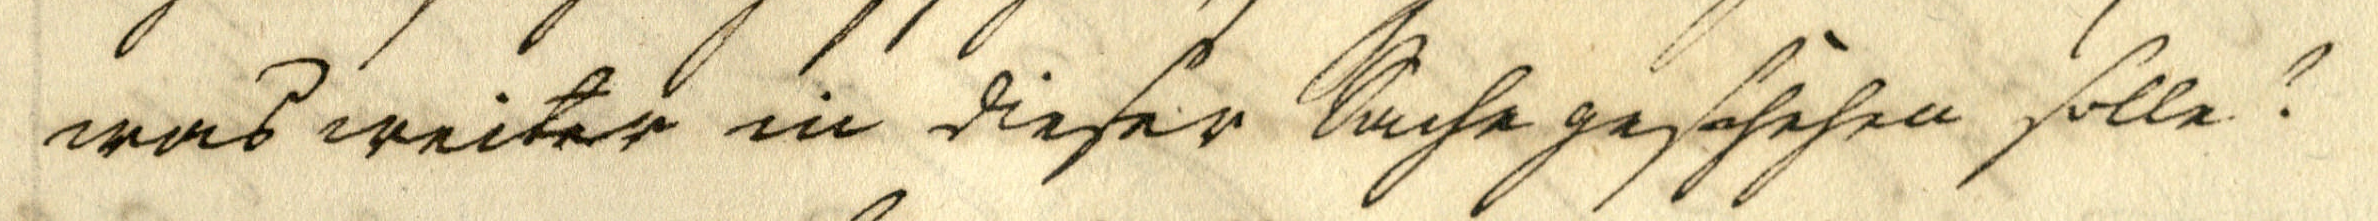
was weiter in dieser Sache geschehen solle?
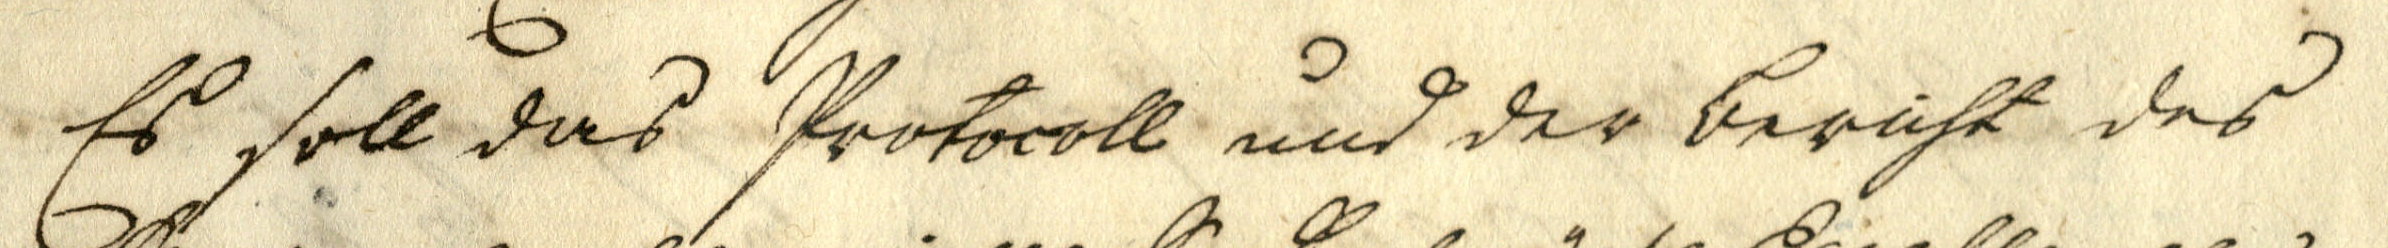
Es soll das Protocoll und der Bericht des
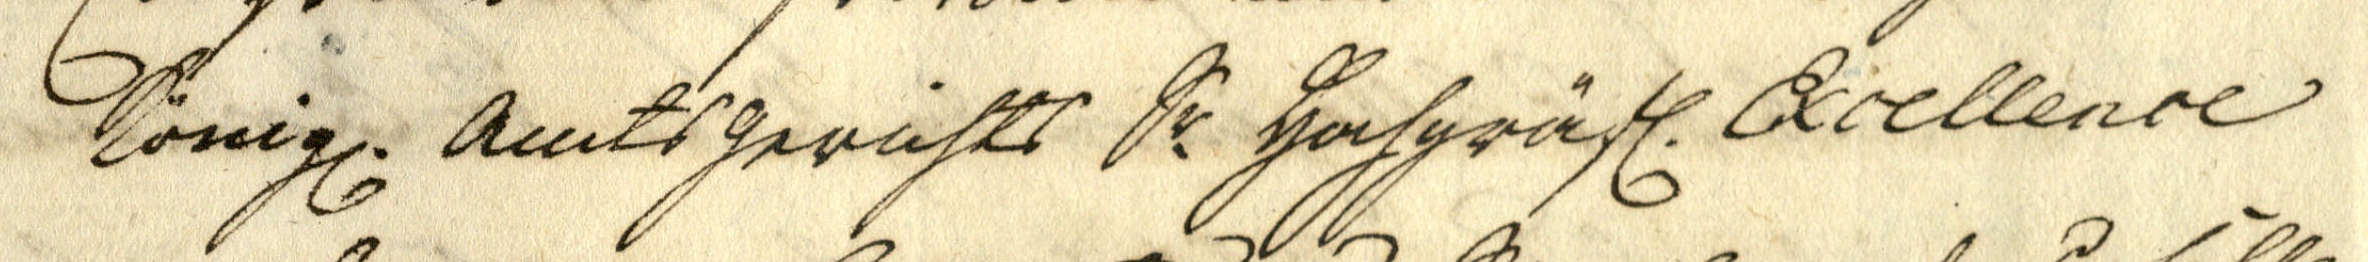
Königl. Amtsgerichts sr. Hochgräfl. Excellence
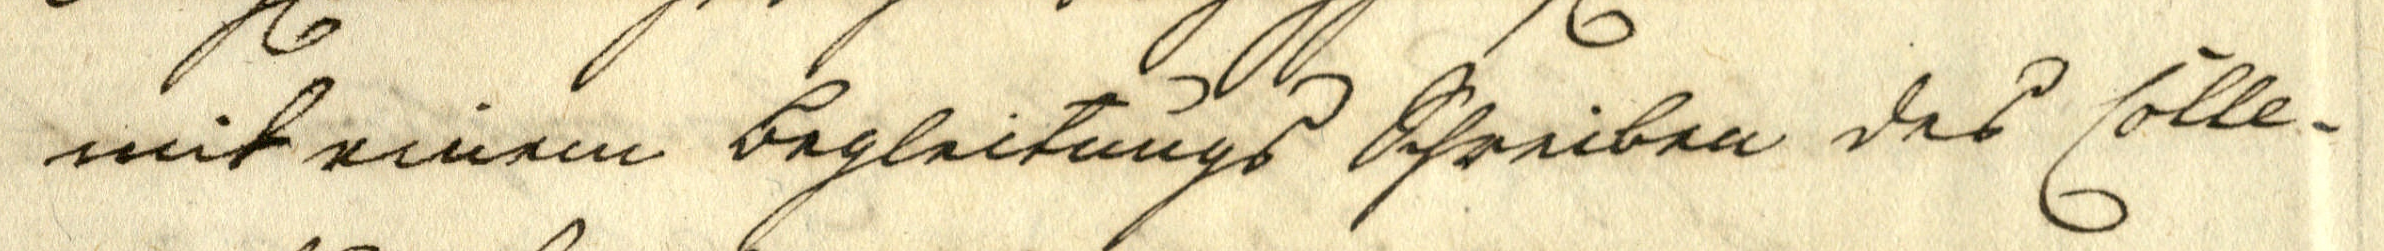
mit einem Begleitungs Schreiben des Colle-
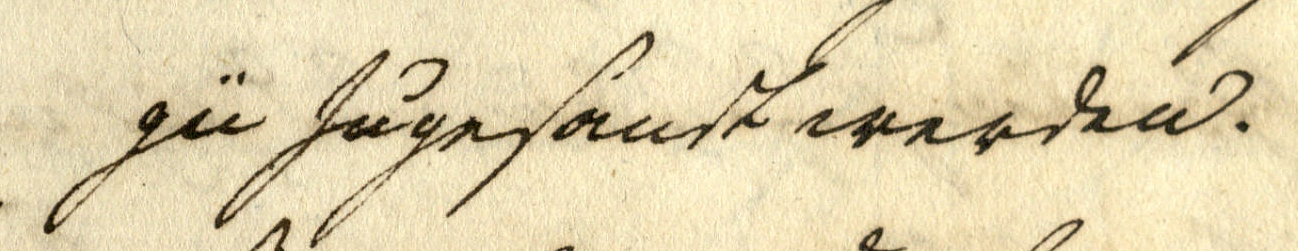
gii zugesandt werden.
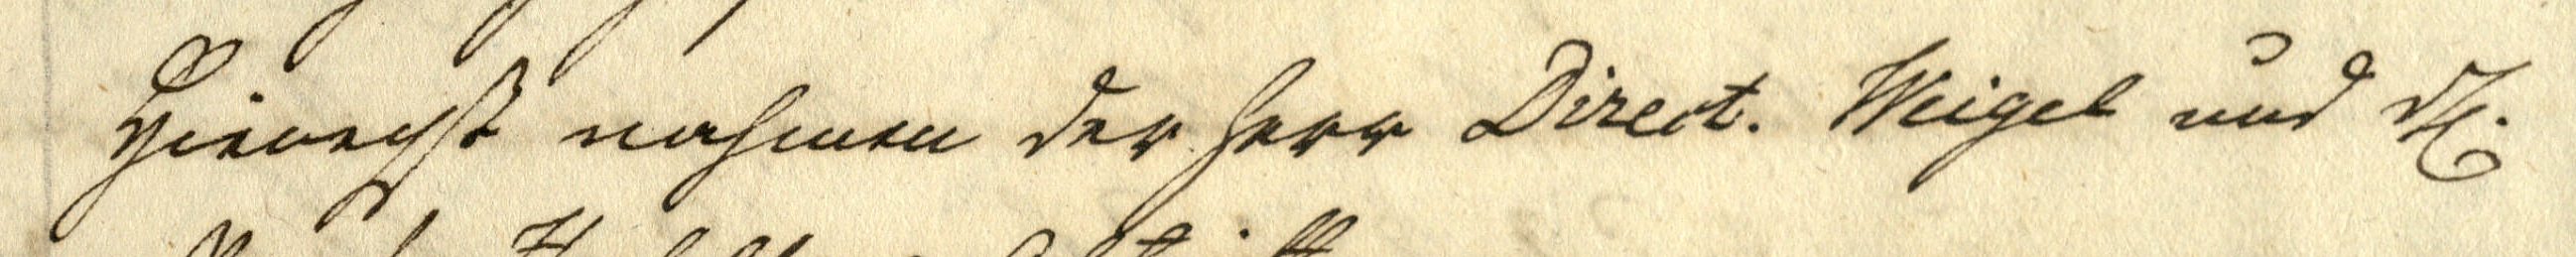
Hienechst nahmen der Herr Direct. Weigel und dh.
